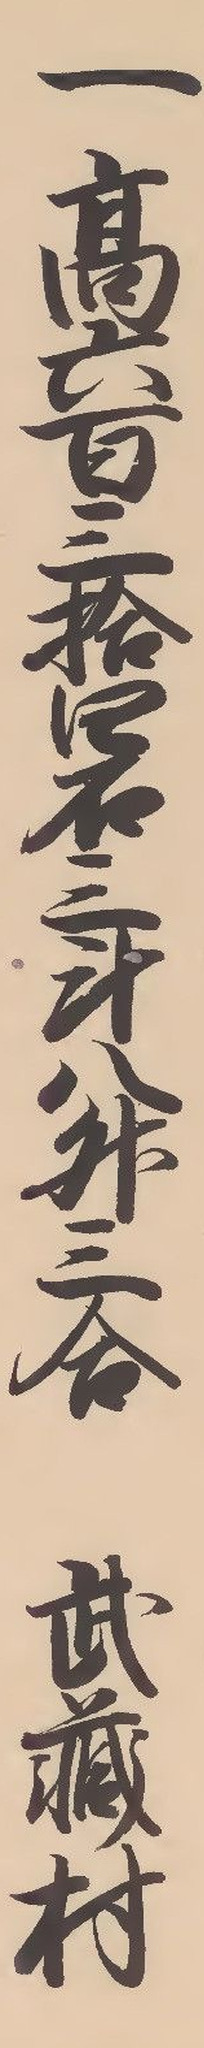一高六百三拾四石三斗八升三合武蔵村
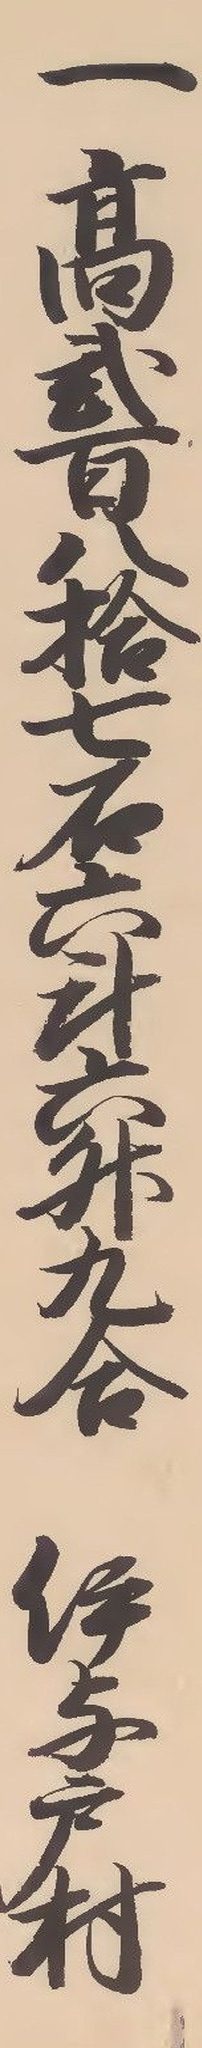一高弐百八拾七石六斗六升九合伊与戸村
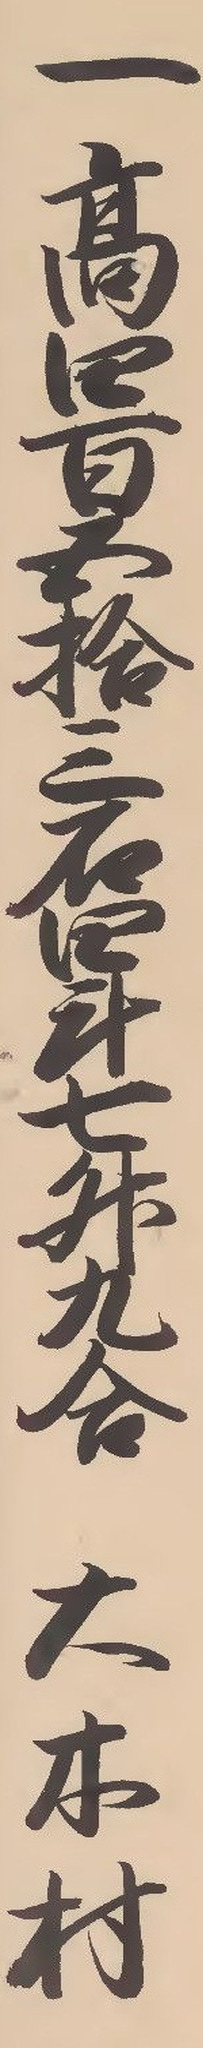一高四百五拾三石四斗七升九合大木村
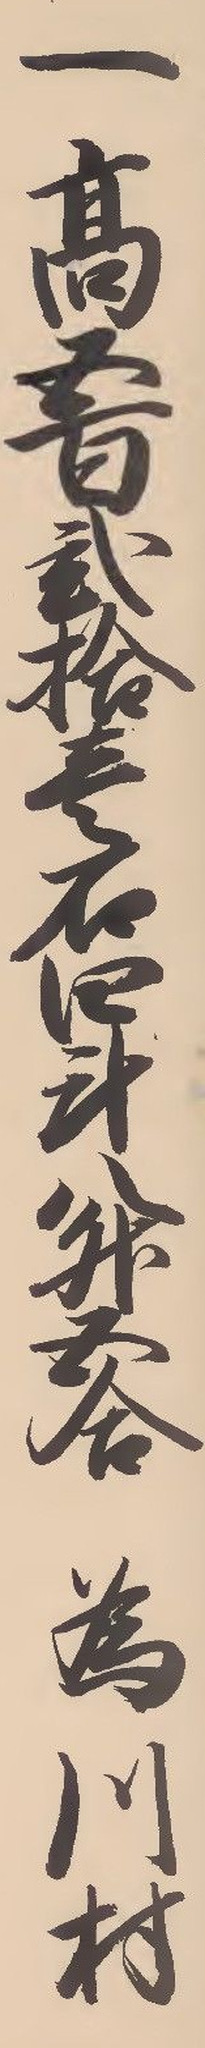一高五百弐拾壱石四斗八升五合為川村
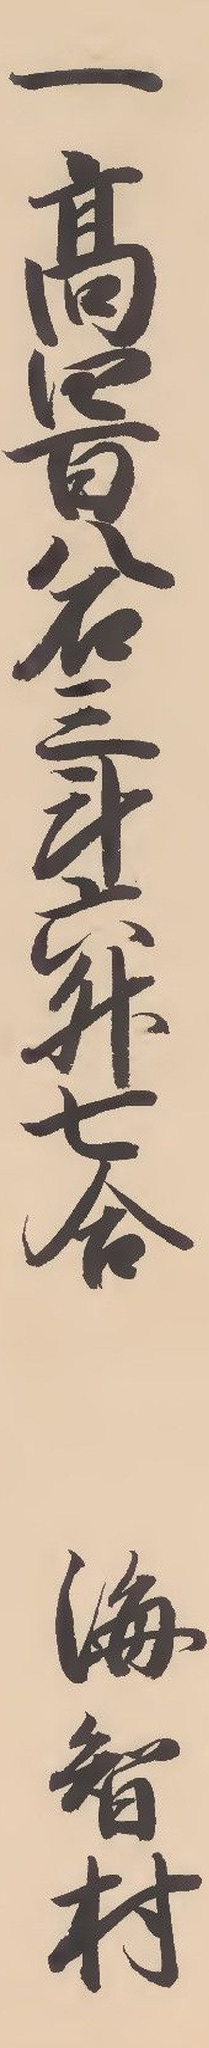一高四百八石三斗六升七合海智村
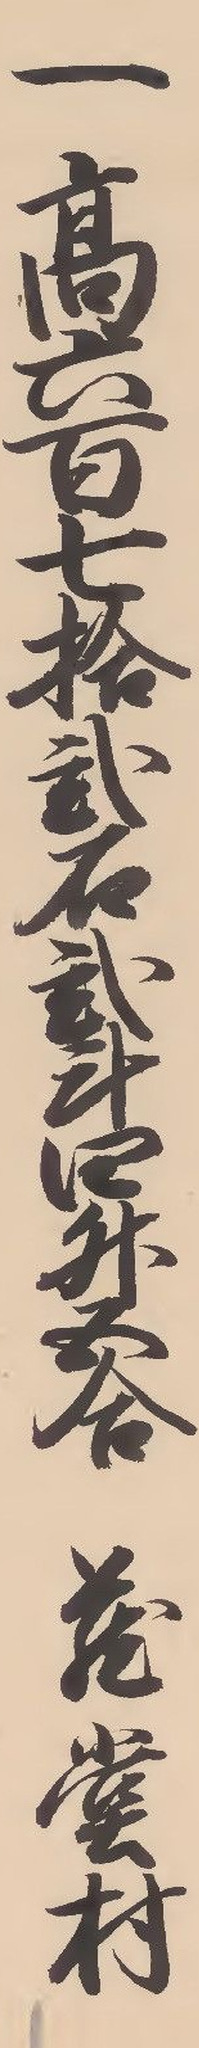一高六百七拾弐石弐斗四升五合蔵堂村
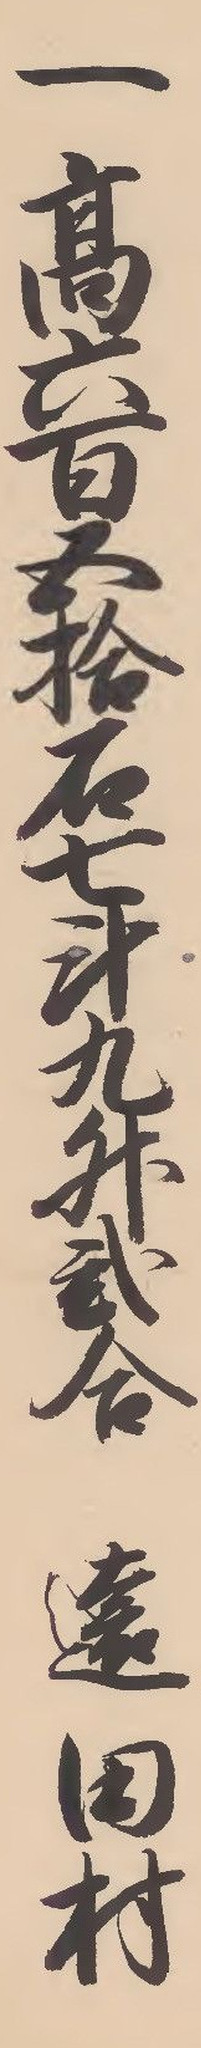一高六百五拾石七斗九升弐合遠田村

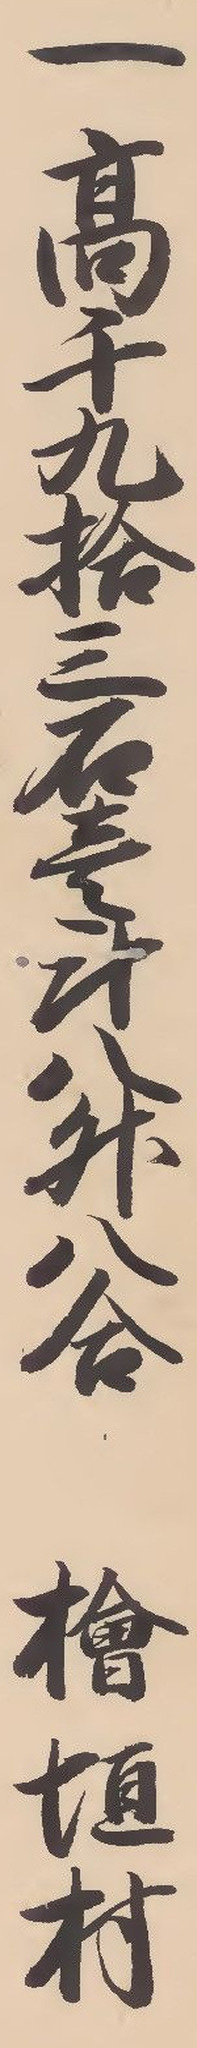一高千九拾三石壱斗八升八合桧垣村
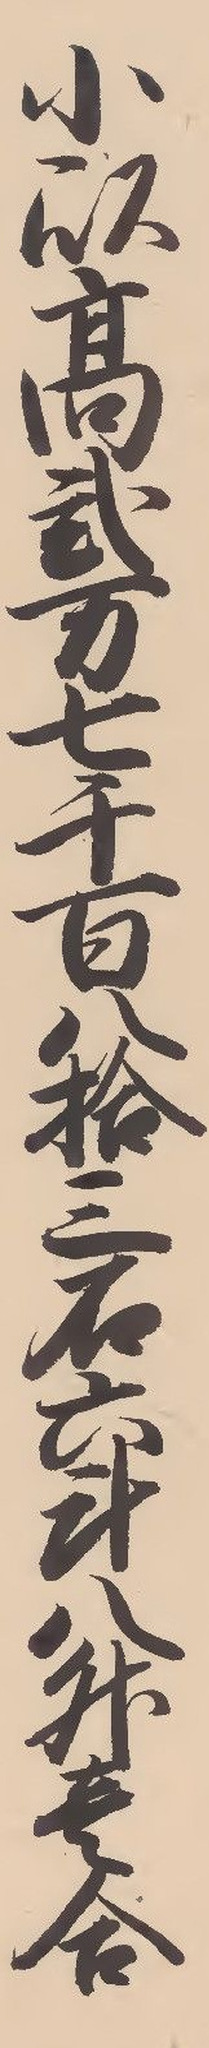小以高弐万七千百八拾三石六斗八升壱合
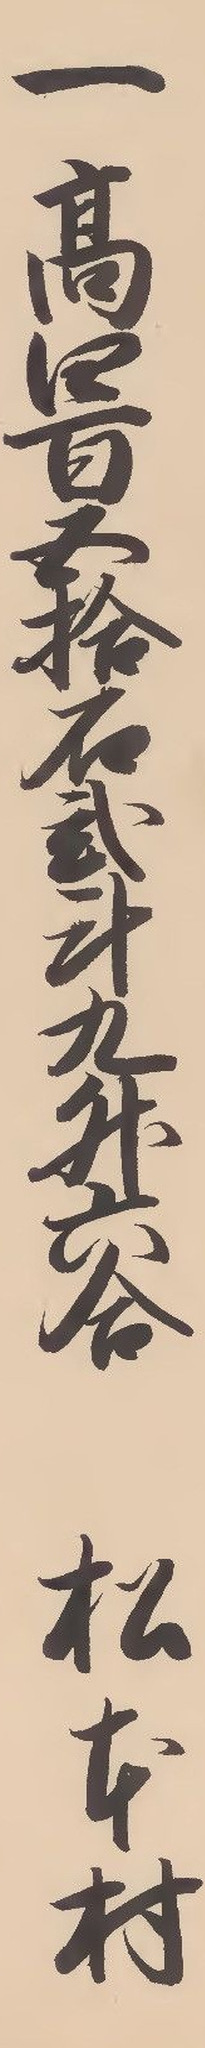一高四百五拾石弐斗九升六合松本村
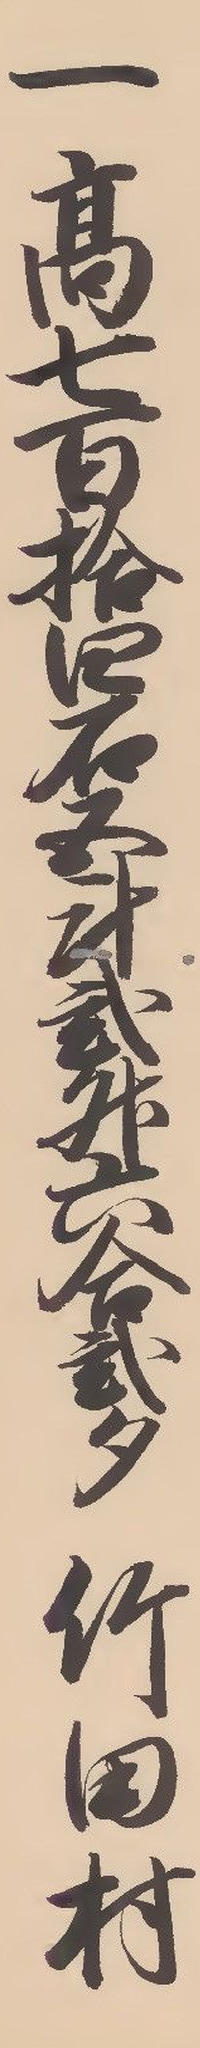一高七百拾四石五斗弐升六合弐勺竹田村

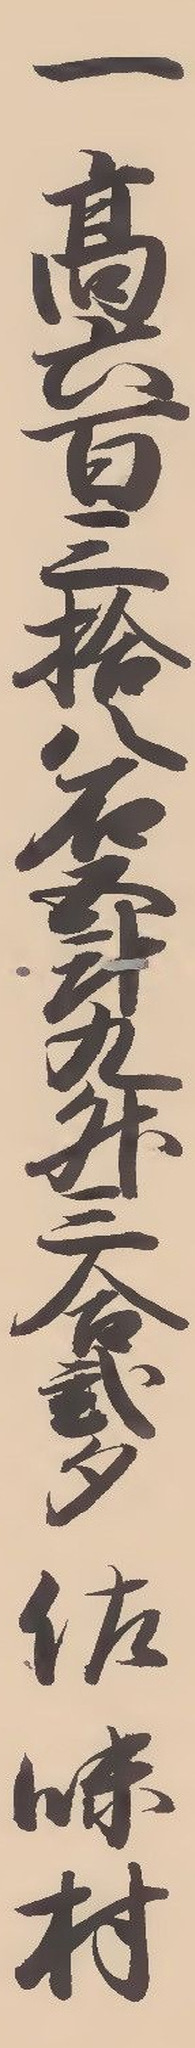一高六百三拾八石五斗九升三合弐勺佐味村
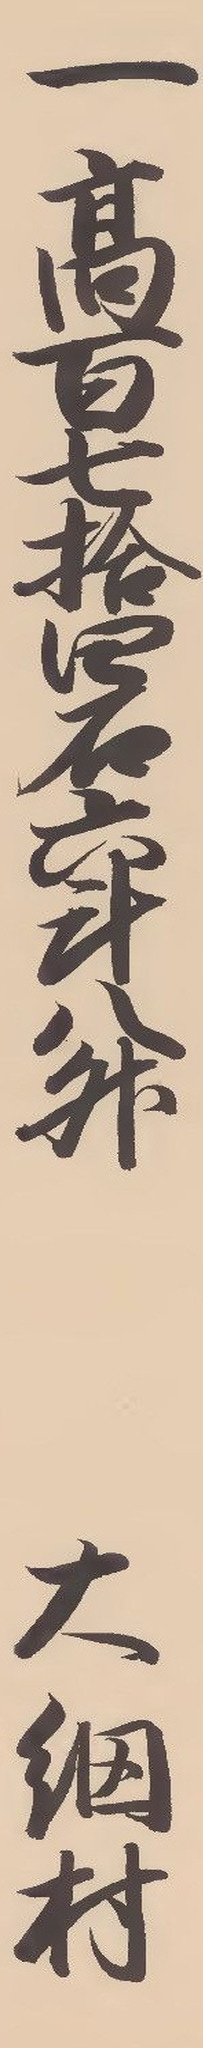一高百七拾四石六斗八升大網村
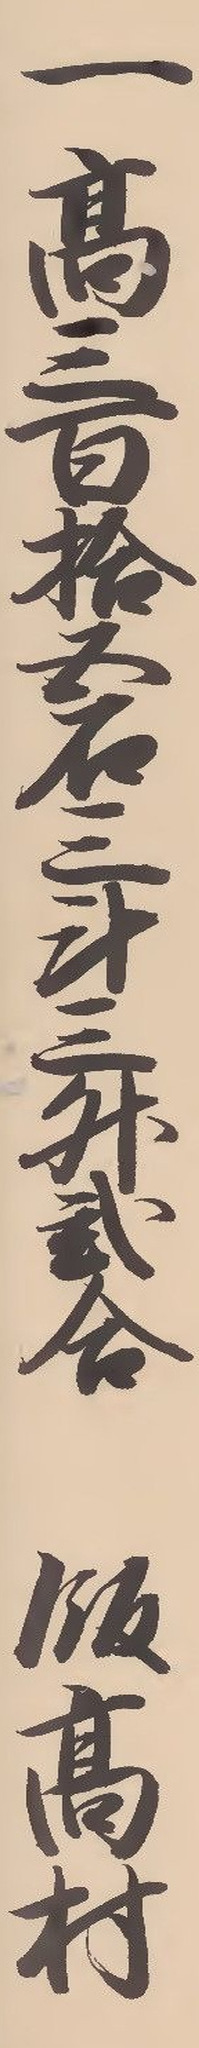一高三百拾五石三斗三升弐合飯高村
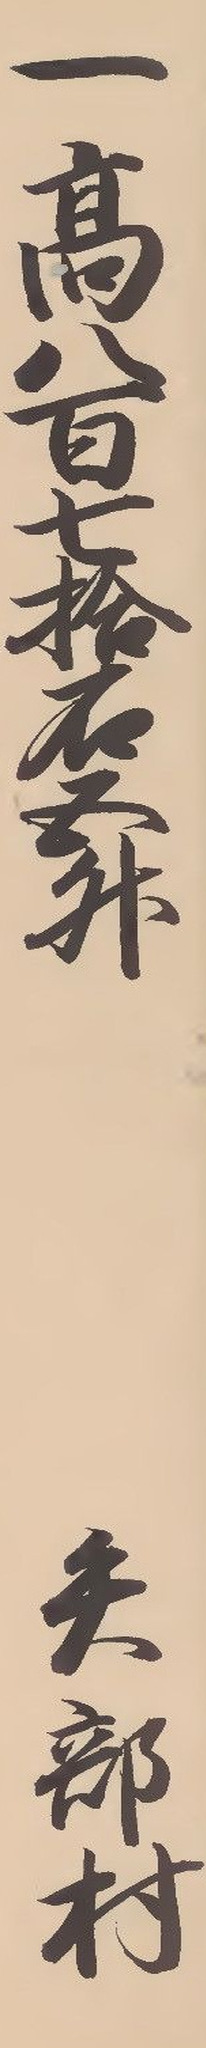一高八百七拾石五升矢部村
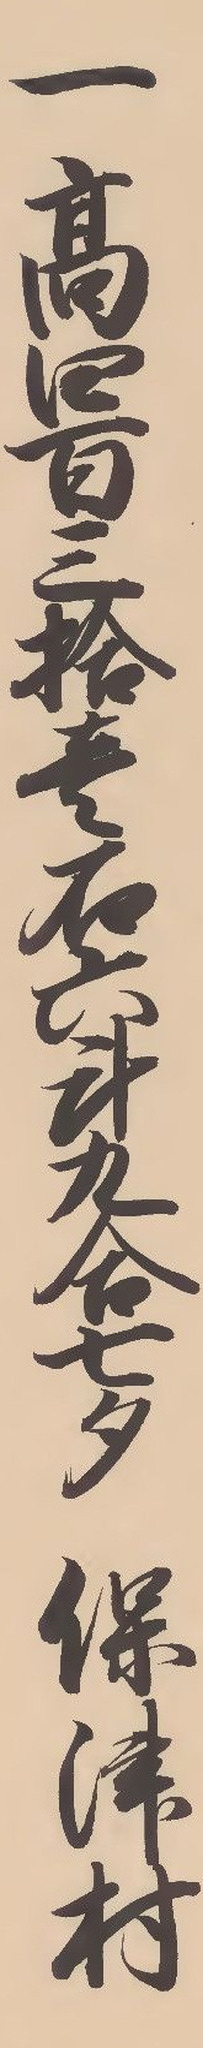一高四百三拾壱石六斗九合七勺保津村
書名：大和国郷帳
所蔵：国立公文書館 National Archives of Japan
